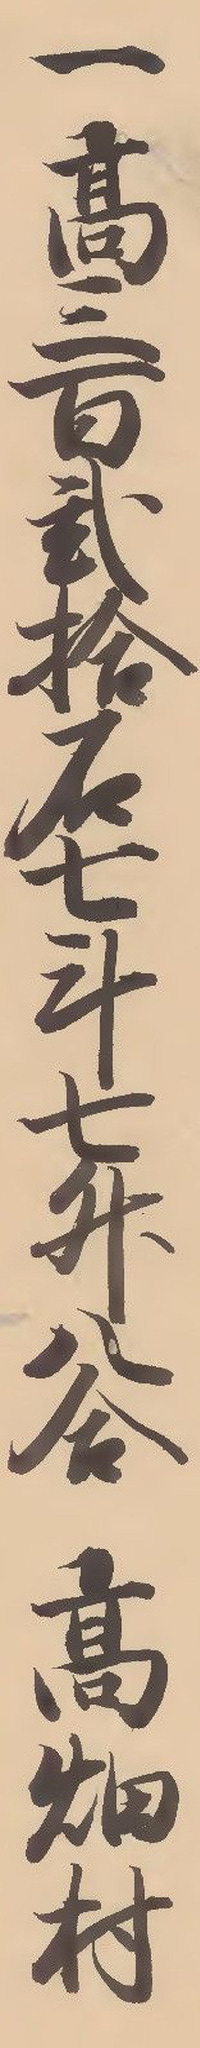一高三百弐拾石七斗七升八合高畑村

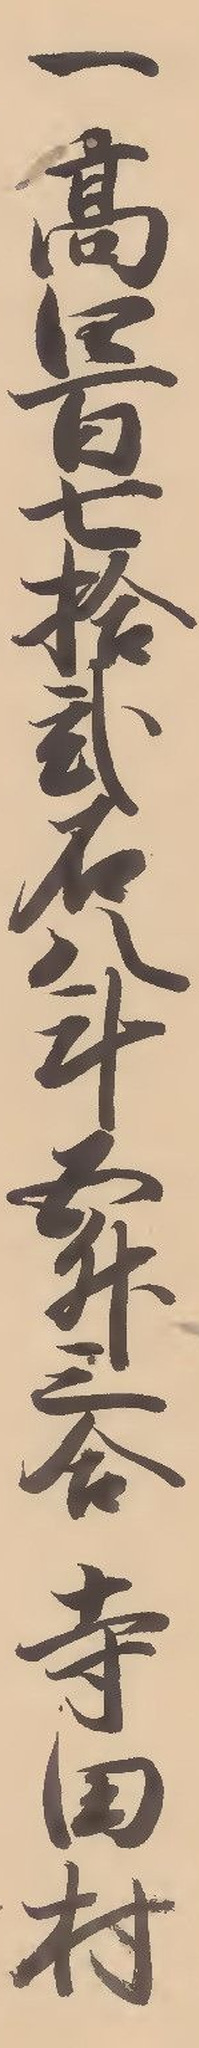一高四百七拾弐石八斗五升三合寺田村
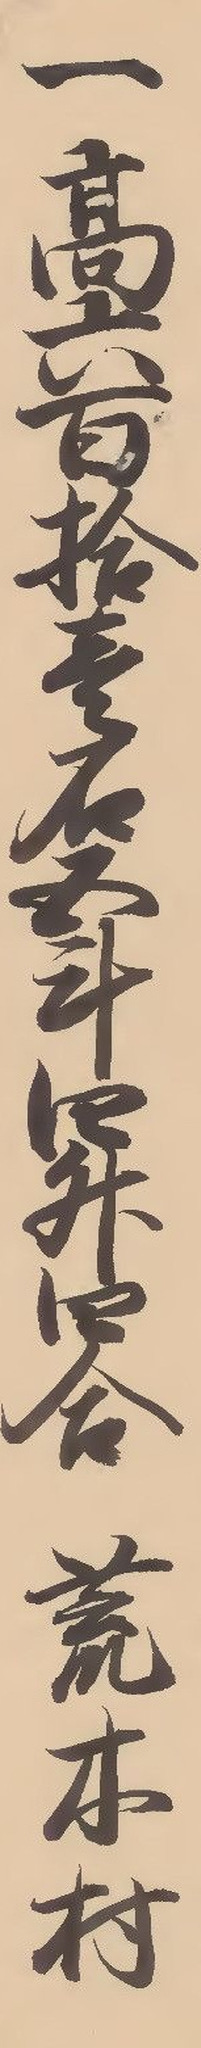一高六百拾壱石五斗四升四合荒木村
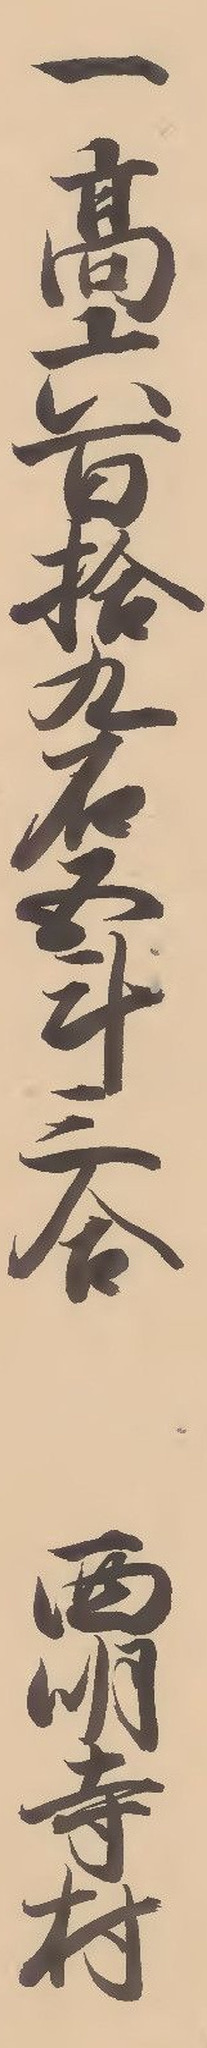一高六百拾九石五斗三合西明寺村
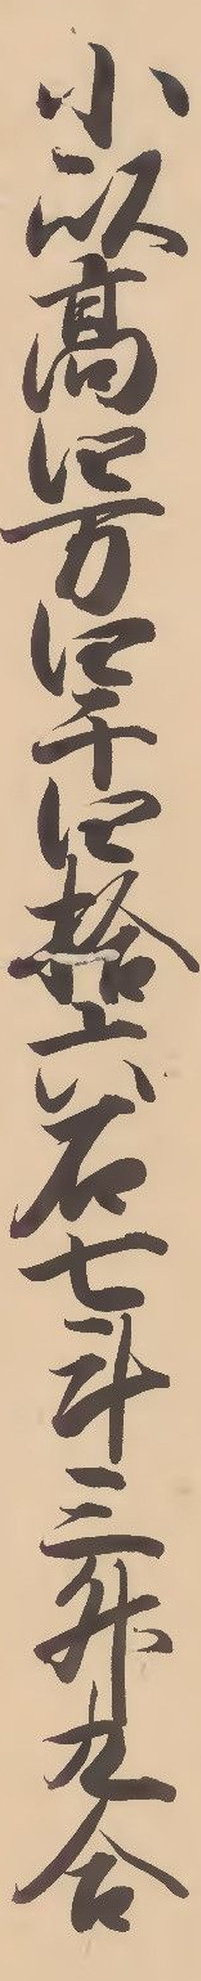小以高四万四千四拾六石七斗三升九合

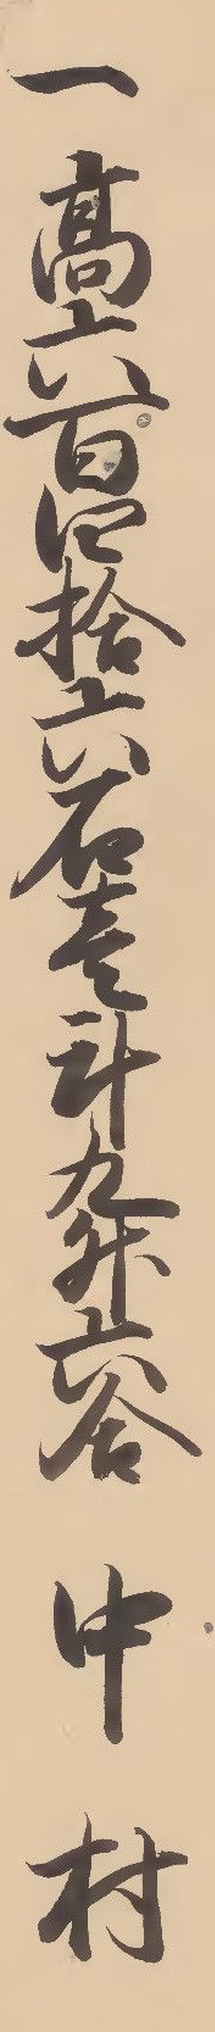一六百四拾六石壱斗九升六合中村
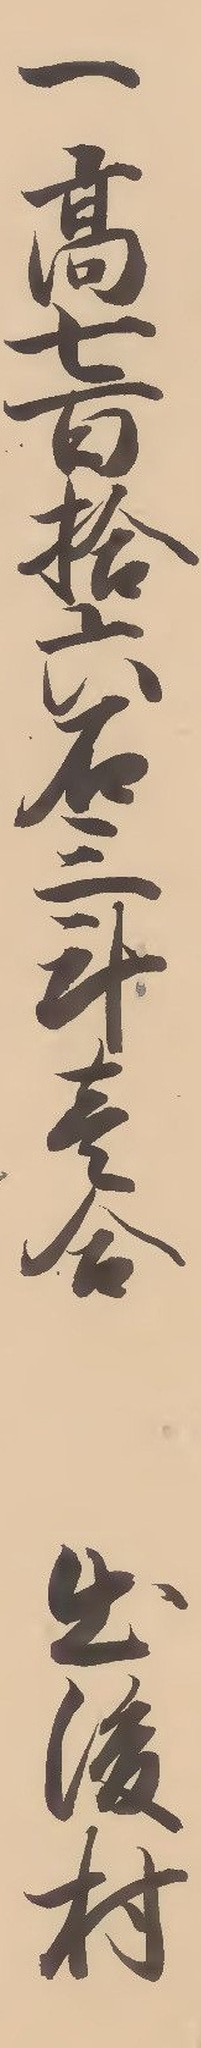一高七百拾六石三斗壱合出後村
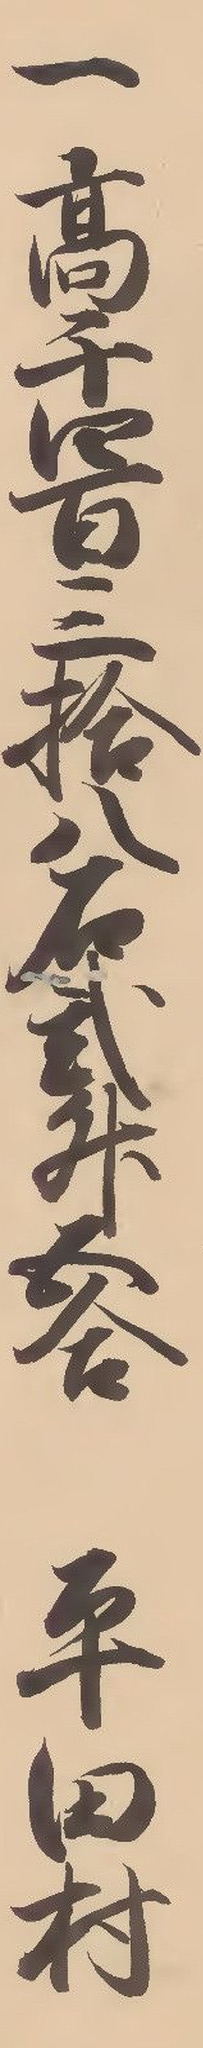一高千四百三拾八石弐斗五合平田村
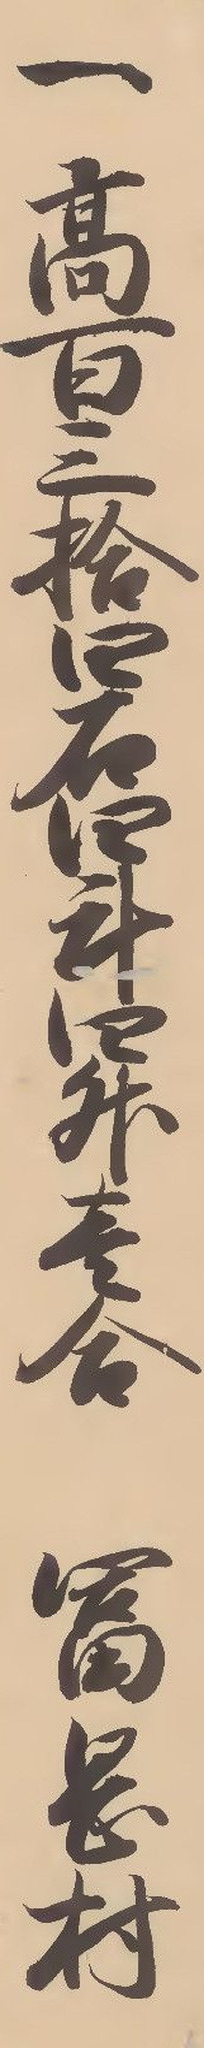一高百三拾四石四斗四升壱合富岡村
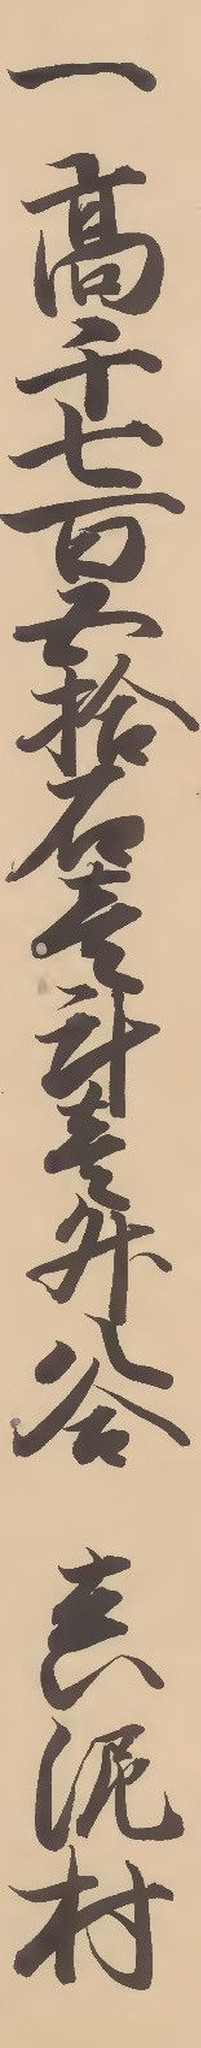一高千七百五拾石壱斗壱升八合真泥村
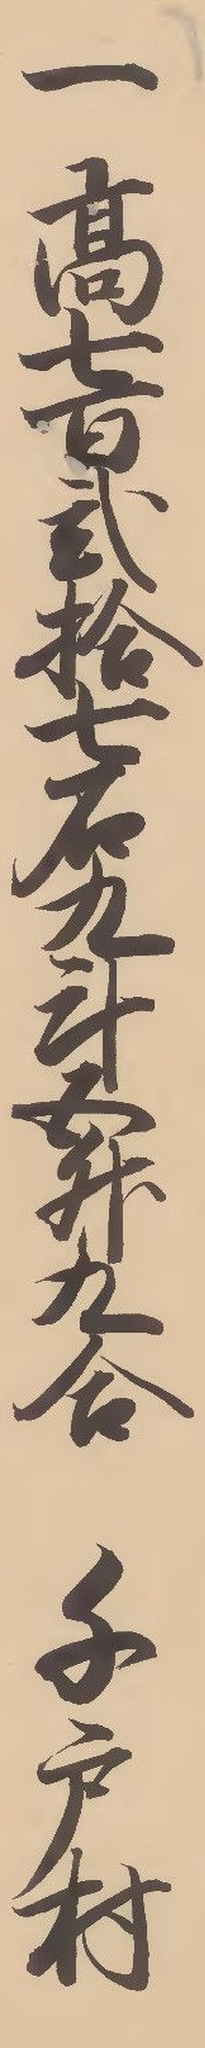一高七百弐拾七石九斗五升九合千戸村
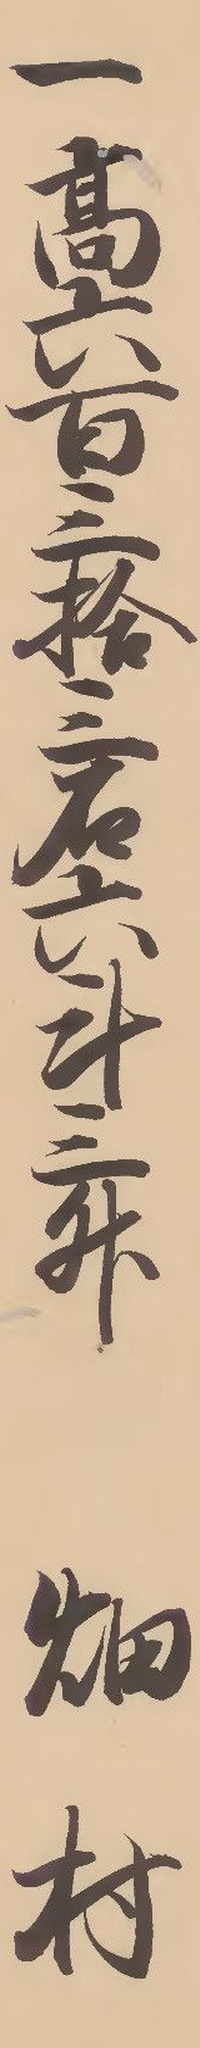一高六百三拾三石六斗三升畑村

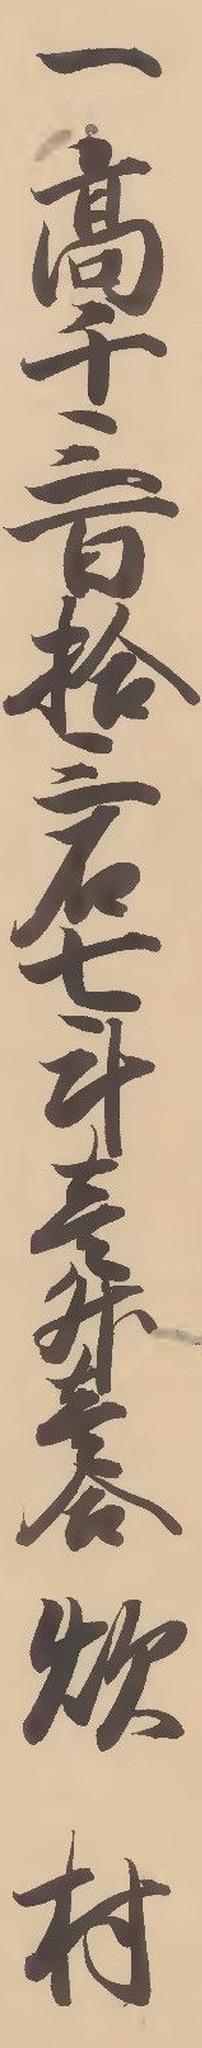一高千三百拾三石七斗壱升壱合炊村
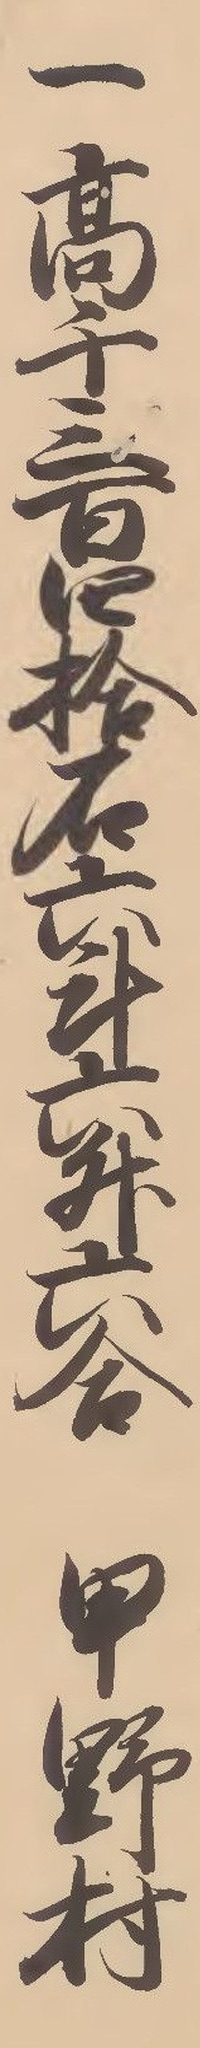一高千三百四拾石六斗六升六合甲野村
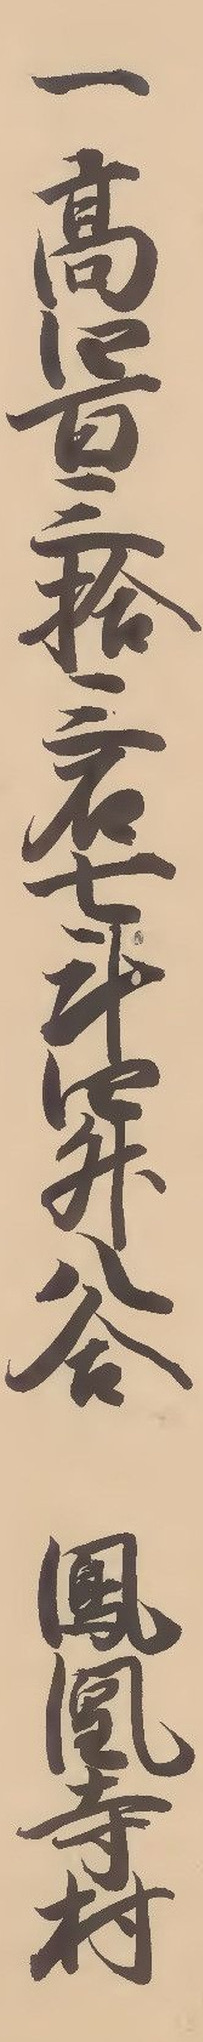一高四百三拾三石七斗四升八合鳳凰寺村
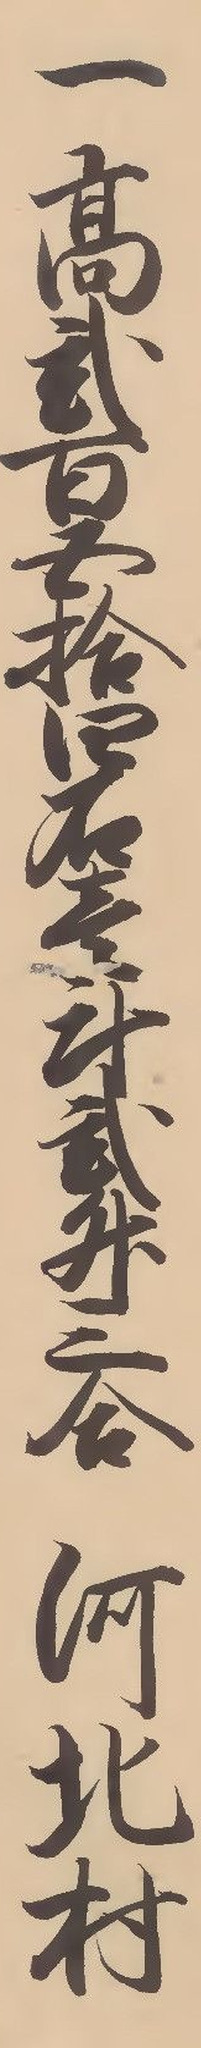一高弐百五拾四石壱斗弐升三合河北村
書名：伊賀国郷帳
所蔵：国立公文書館 National Archives of Japan
